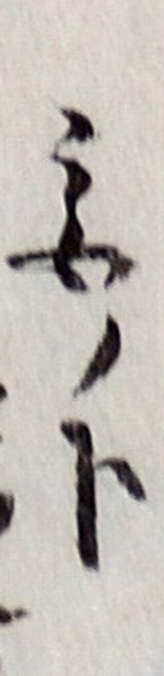宮ノ下
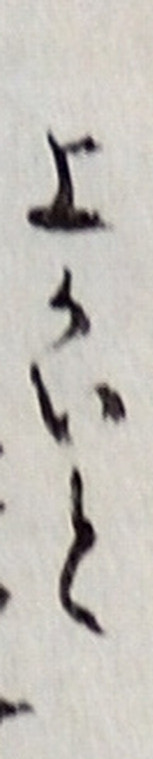上かいと
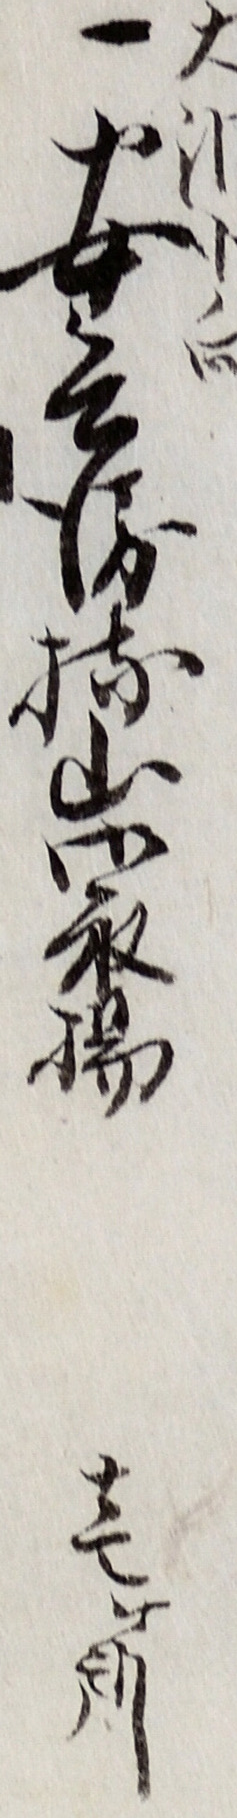一安兵衛持山御取場壱ヶ所
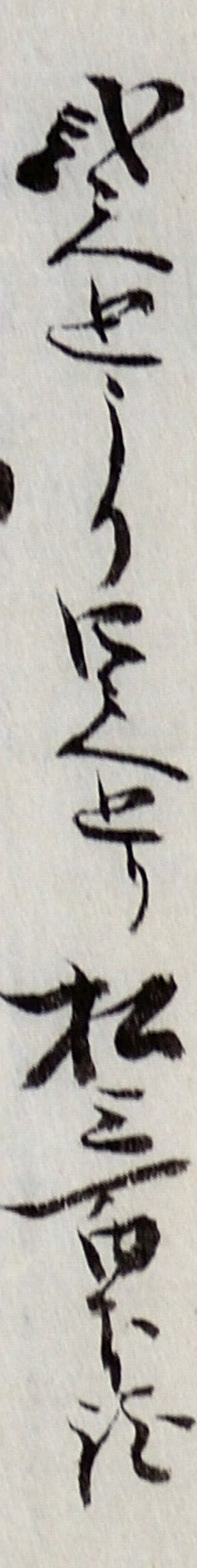弐尺廻より四尺廻り松三百本程
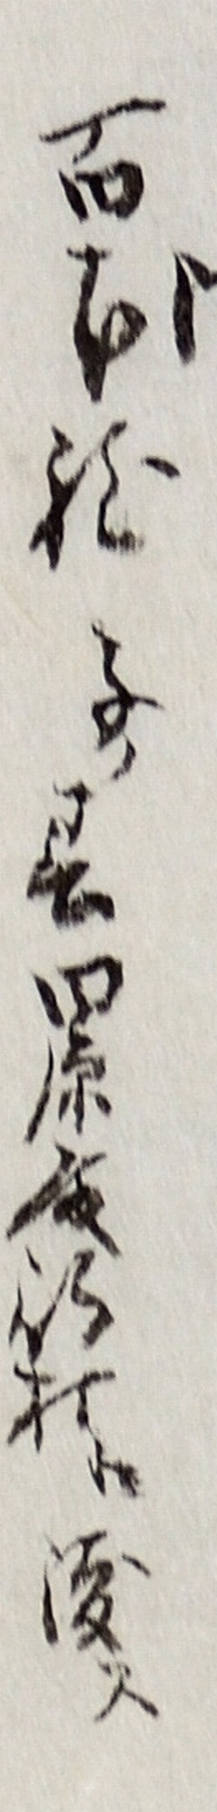百本程子ノ春田原殿役村え渡ス
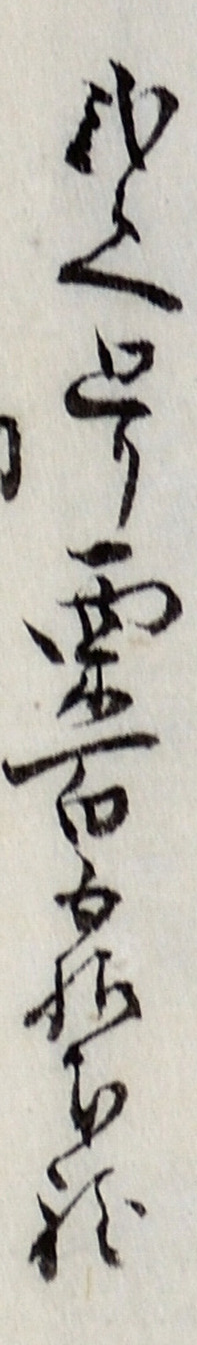弐尺廻り栗百五拾本程
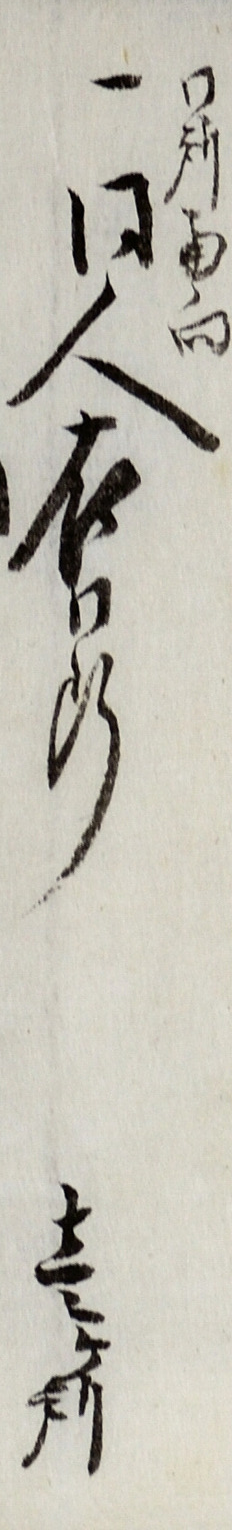一同人右同断壱ヶ所
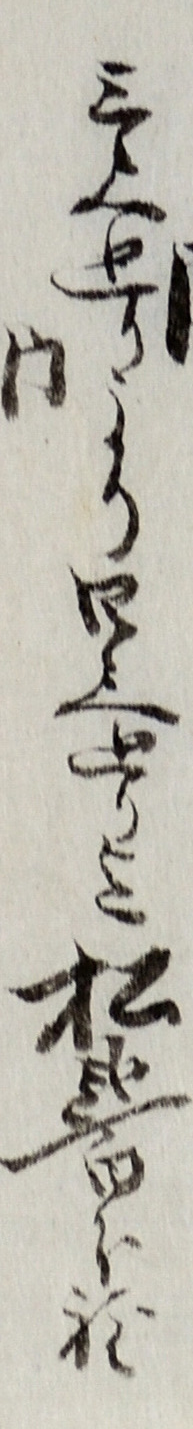三尺廻りより四尺廻り迄松弐百本程
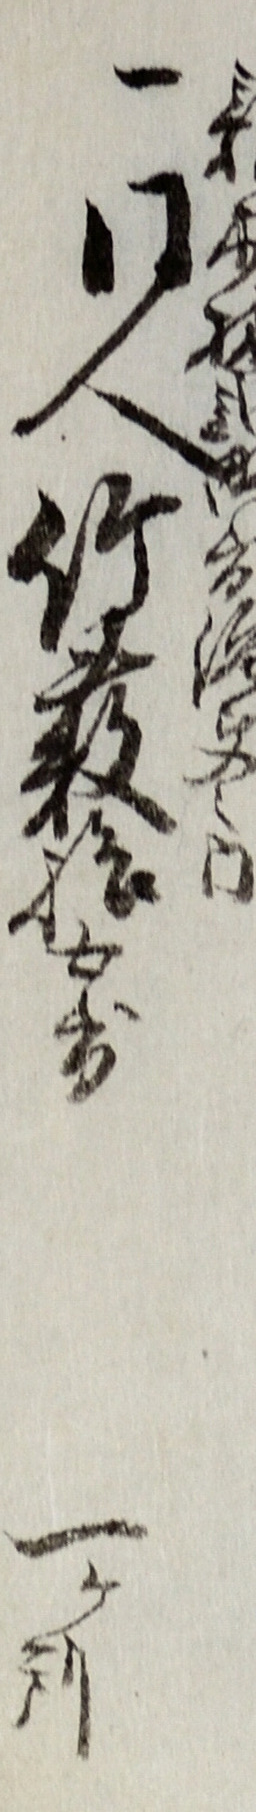一同人竹藪拾五歩一ヶ所
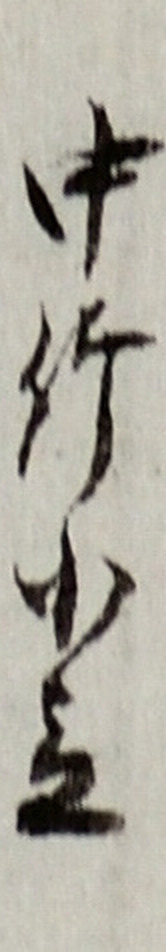中竹小立
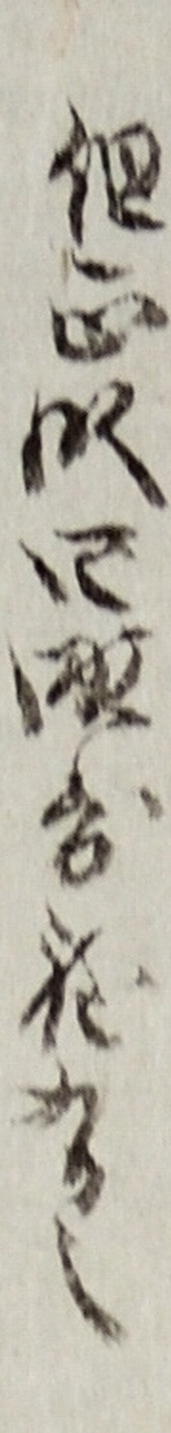但正畝四畝歩程有之
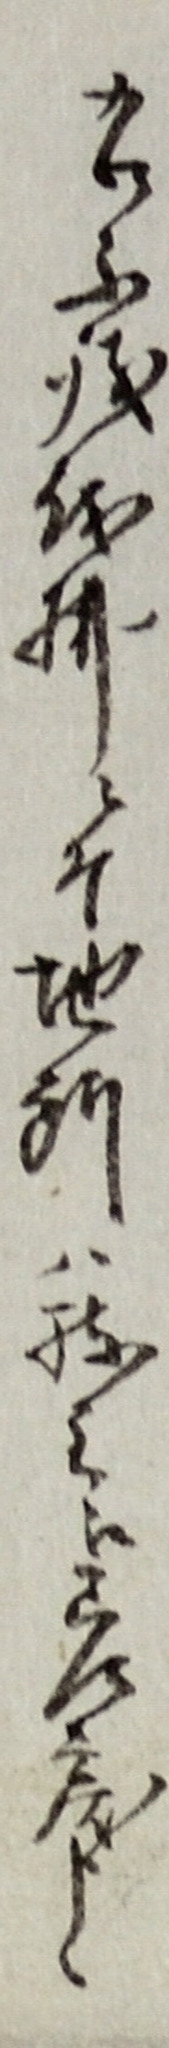右不残伐払ニ付地所ハ持主え差戻申候
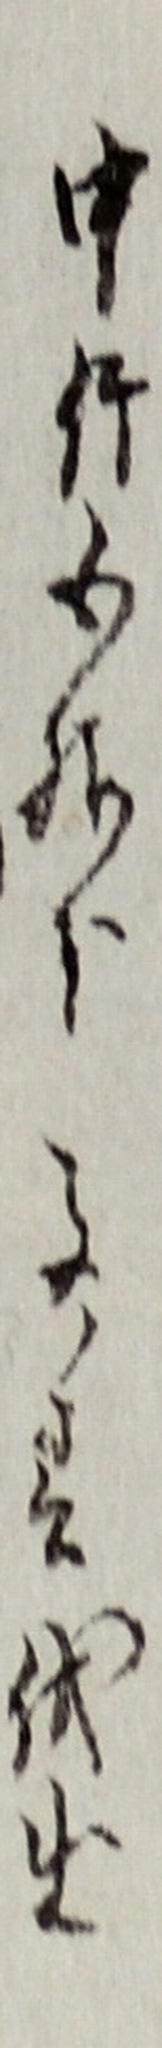中竹五拾本子ノ春伐出

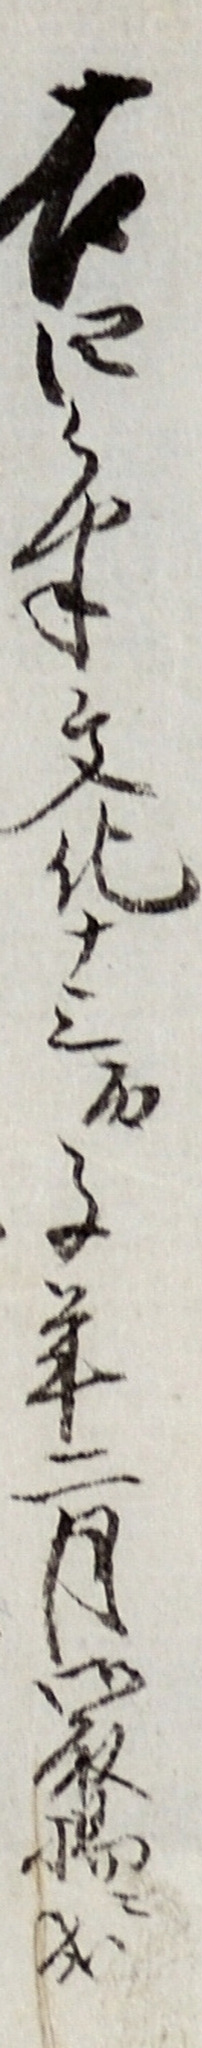右四筆文化十三丙子年二月御取場ニ成
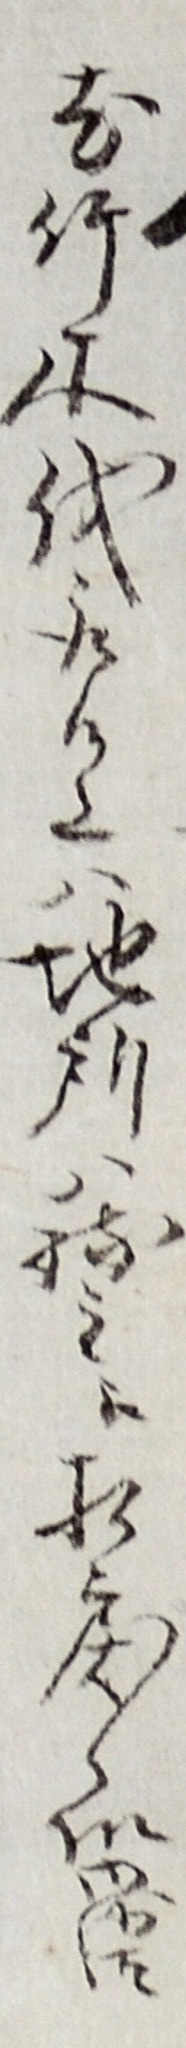尤竹木伐取候上ハ地所ハ持主え相戻候様御沙汰
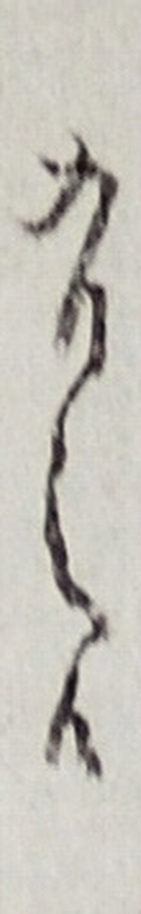有之候
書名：郷中御林御竹薮名所附守之名前帳
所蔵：伊那市立高遠町図書館・合同会社AMANE
